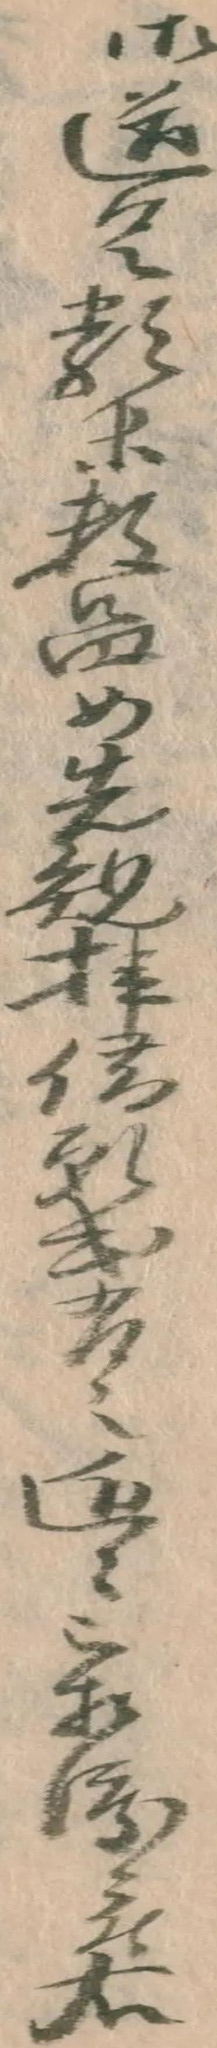御送具類等数品如先規拝借願出有之近々被相渡ニ付右
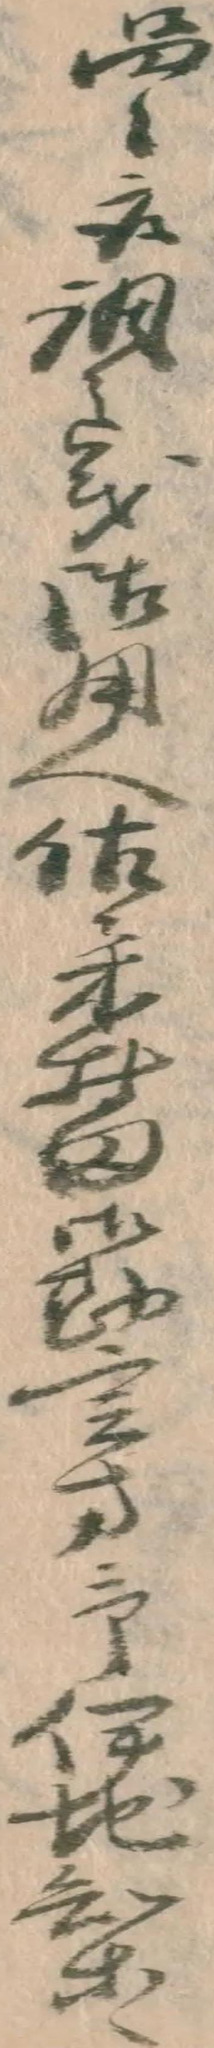品々取調之義御用人佐〻木村田御勘定方予申伊地知等へ
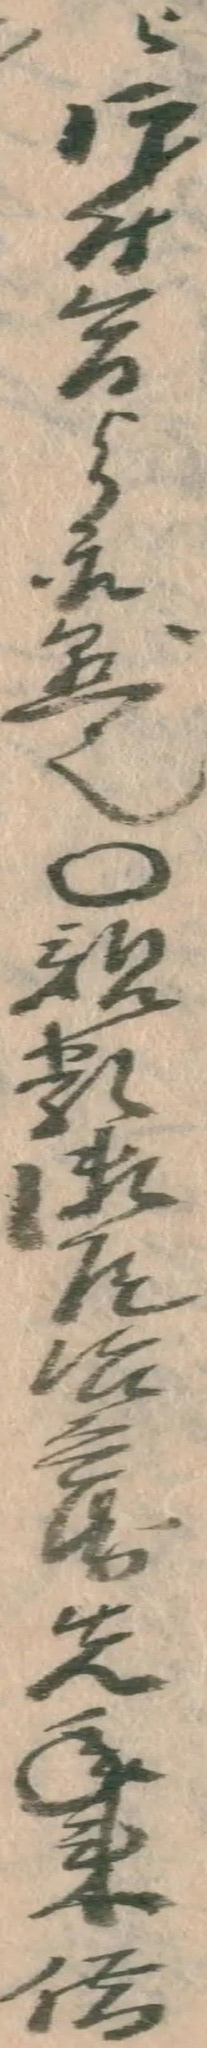被仰付今日より取懸也○親類瀬尾治兵衛先年来借
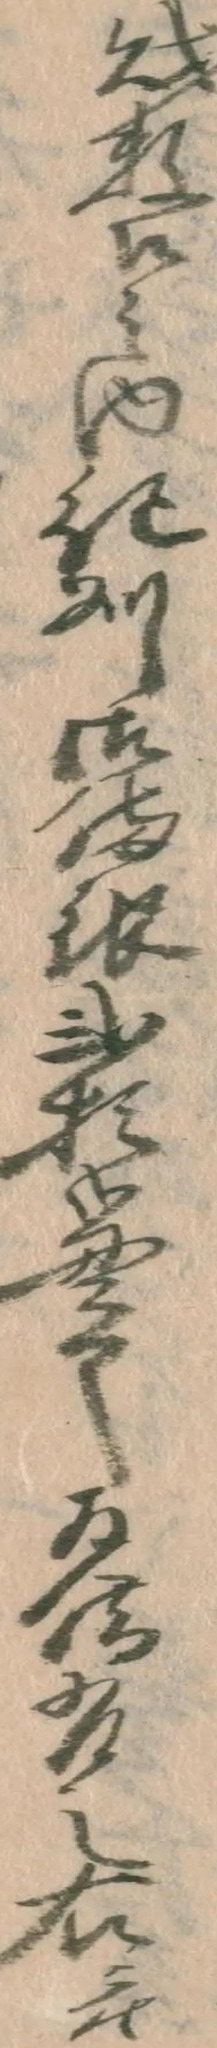財数日之内紀州御備銀弐拾弐貫之拝借有之右ニ付
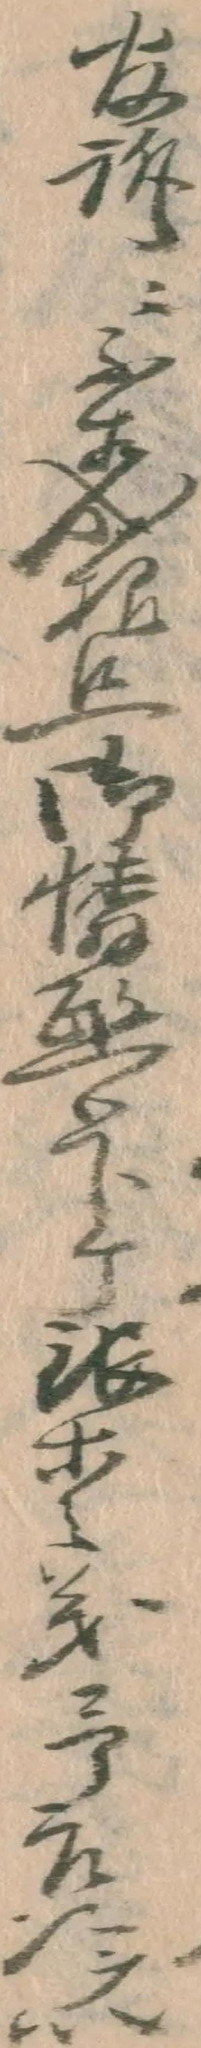官訴ニ不相成様且御憐愍被下け銀等之義予取次ヲ以
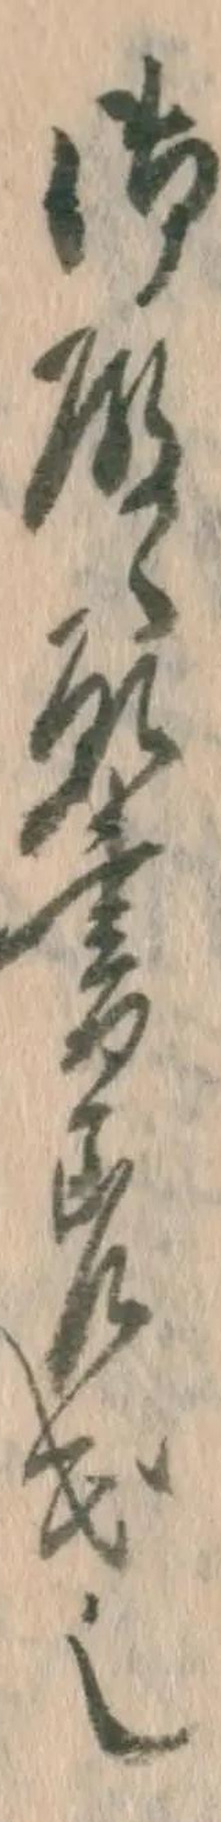御殿へ願書差出也
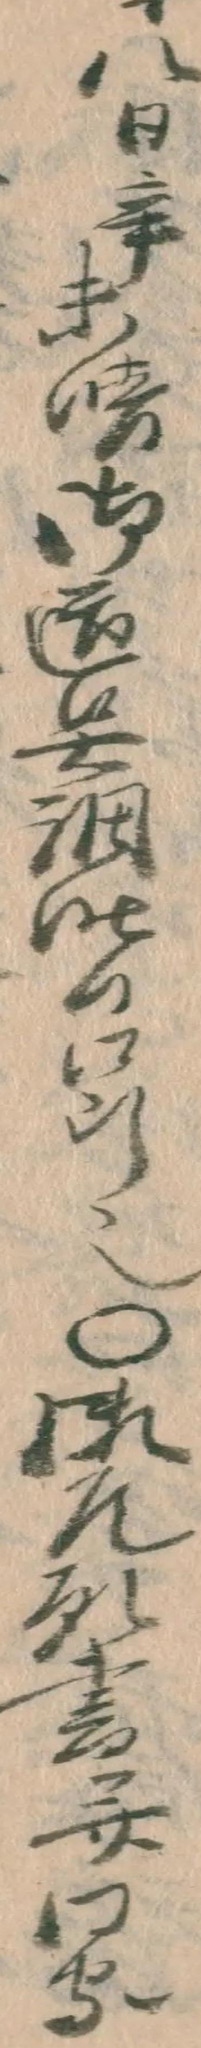十八日辛未晴御道具調昨日同断也○瀬尾願書幷同家
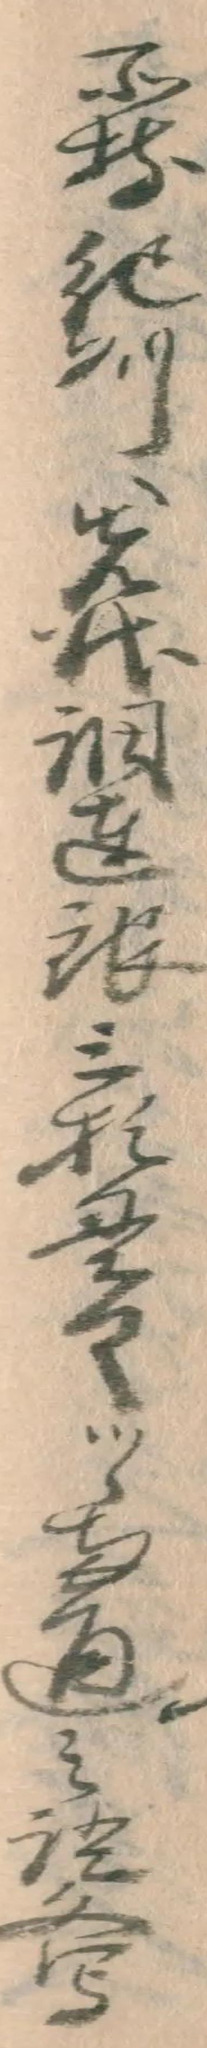所持紀州へ先代調達銀三拾貫匁ツヽ両通之證文写
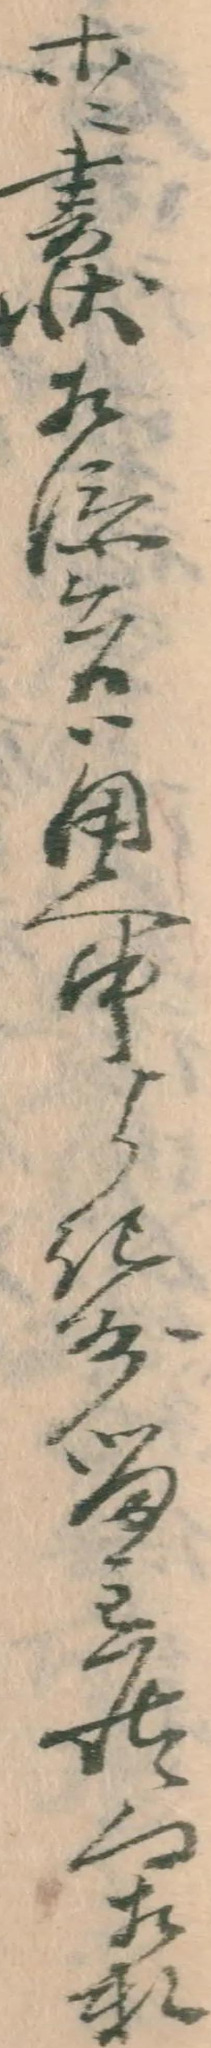等ニ書状相添今日ハ用人中より紀州留主居向相頼
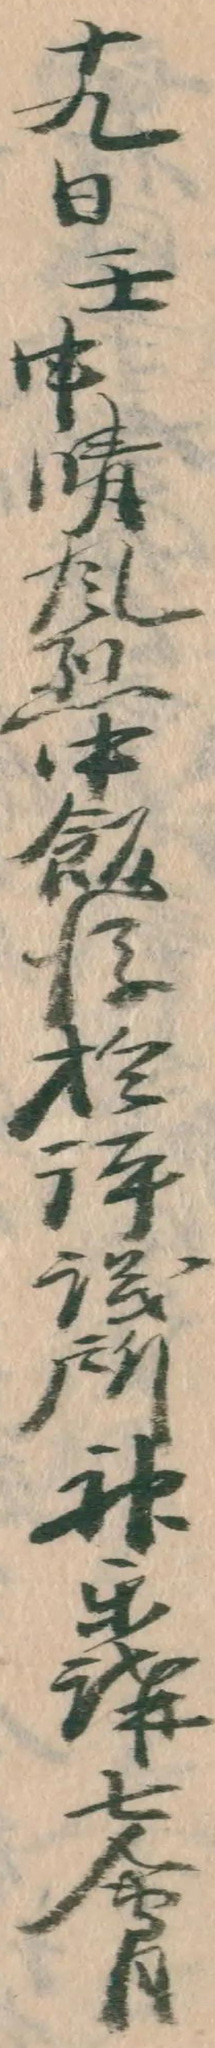十九日壬申晴風烈中飯後於評議所神楽講七會目
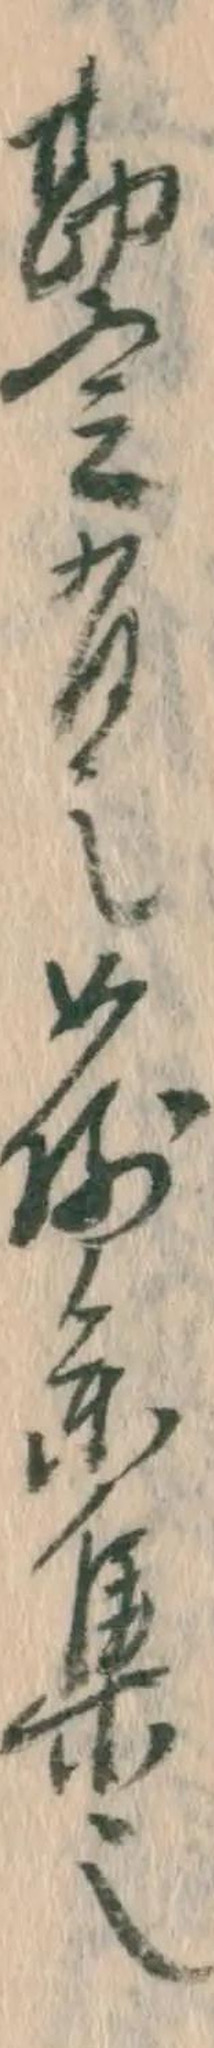勘定有之如例参集也
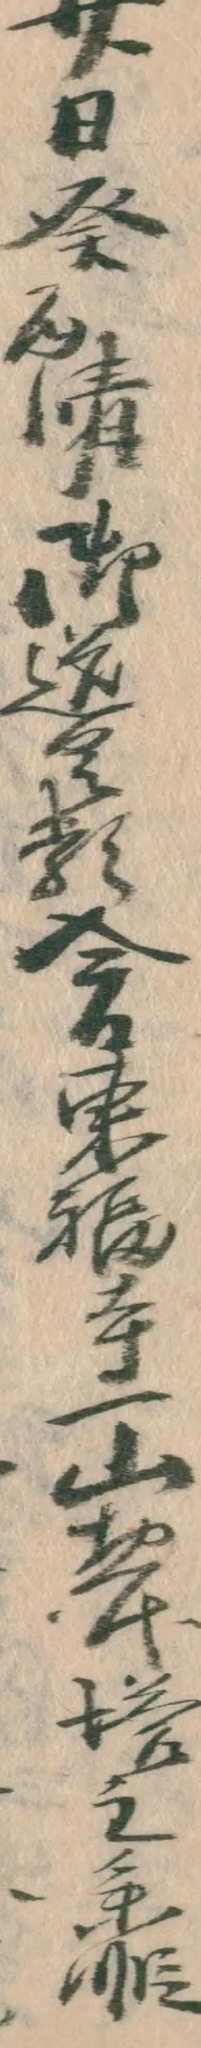廿日癸酉晴御道具類今日東福寺一山惣代塔主参暇
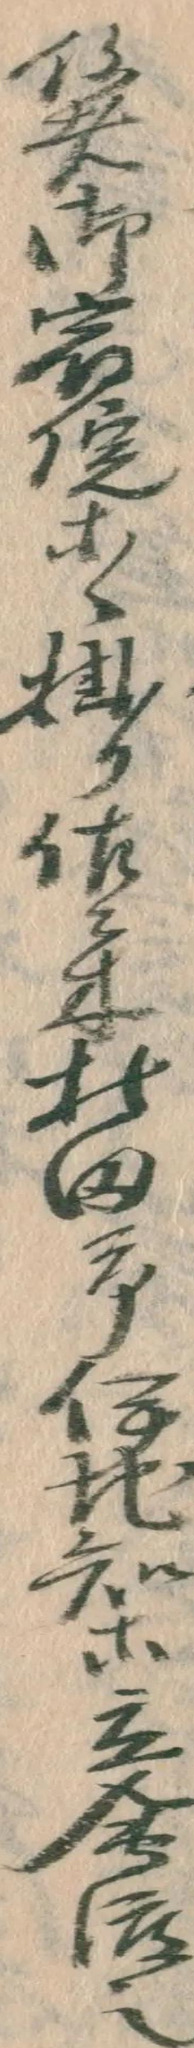役者御宿院等へ掛り佐〻木村田予伊地知等立會渡之
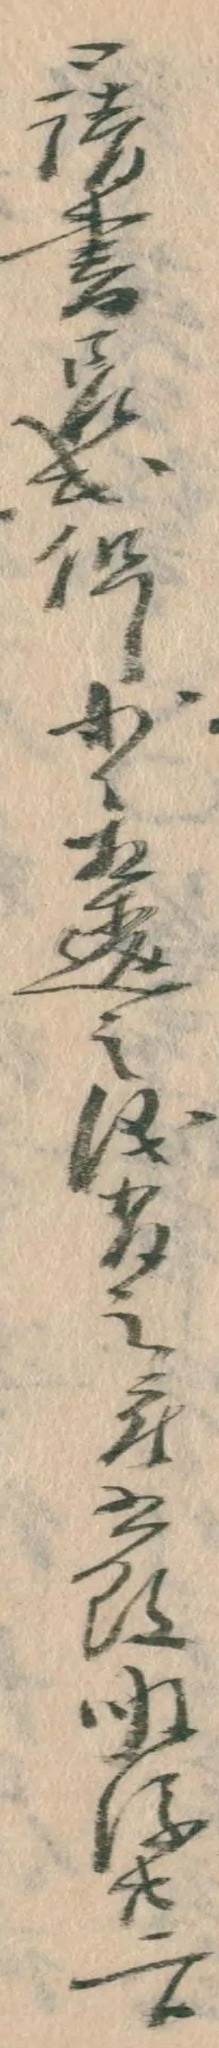御請書差出但し少々相違之儀有之ニ付書改明後廿二日
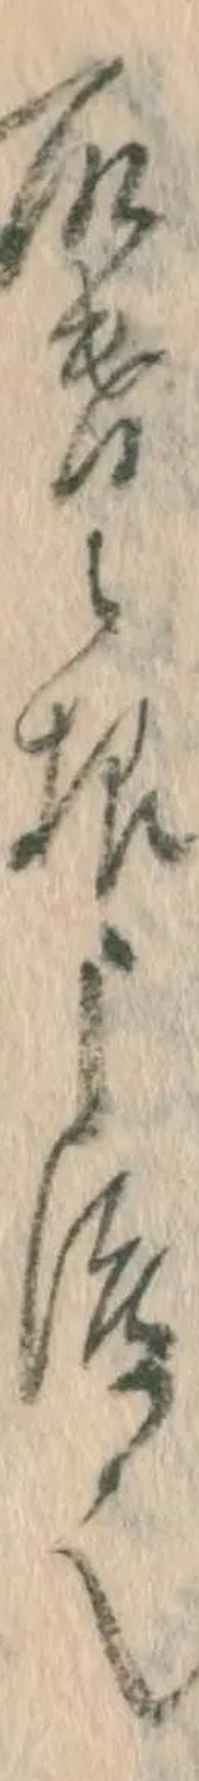取遣候様申渡也
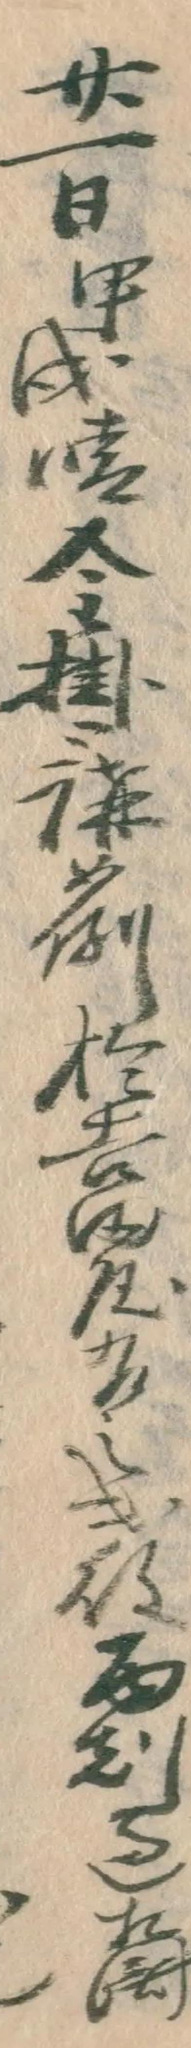廿一日甲戌晴金掛講如例於吉田屋有之出役酉刻過相済
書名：賀茂社記録. 第67冊
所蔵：国立国会図書館 National Diet Library, JAPAN
